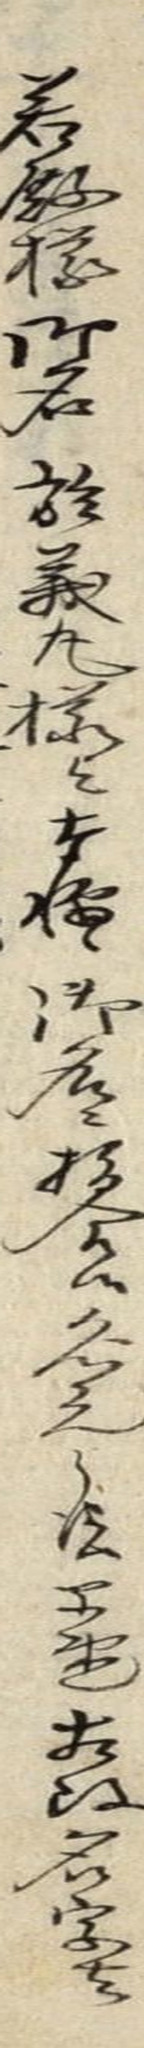若殿様御名於義丸様と奉称候御名に指合候名元之儀は早速相改名字は
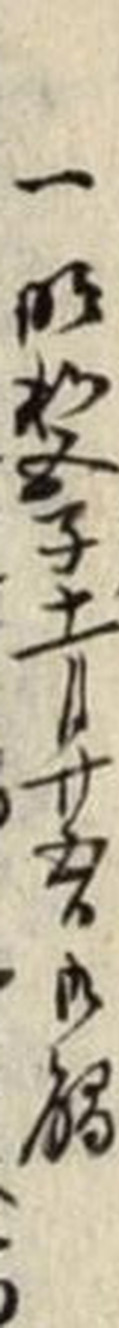一明和五子十一月廿五日御触
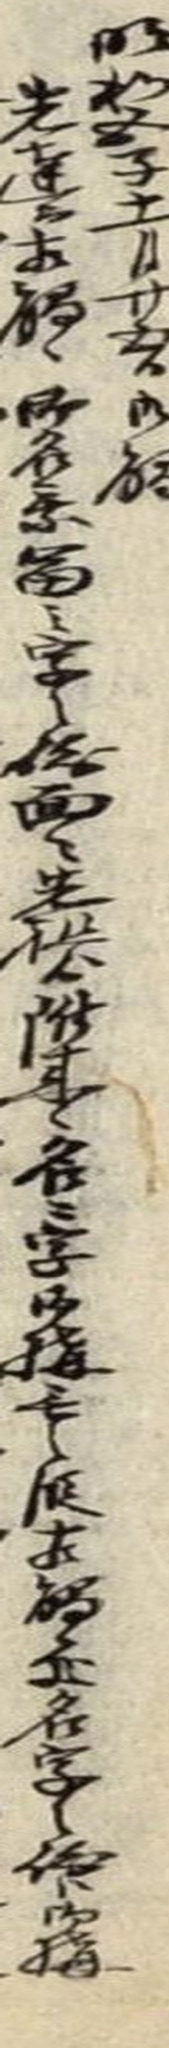先達而相触候御名乗冨之字之儀面々先祖ゟ附来候名之字御構無之段相触置名字之儀は御構
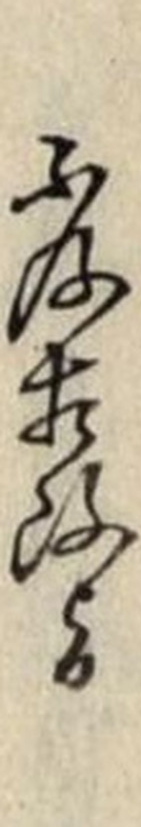不及相改旨
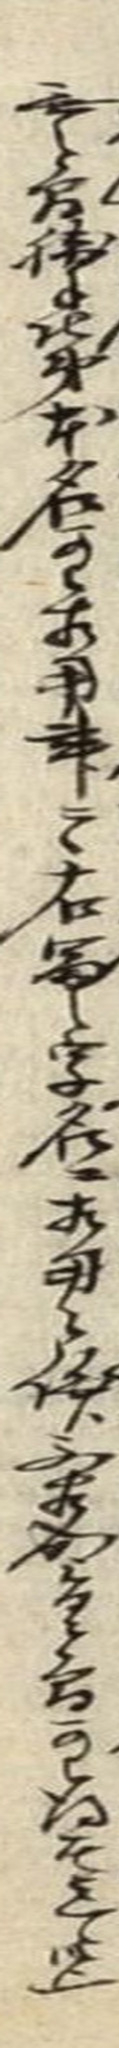無之候間勝手次第本名可相用事に候右冨之字名に相用候儀は不相成旨に候間可被得其意候以上
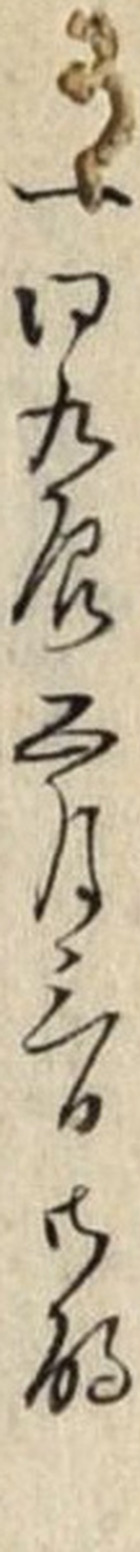一同九辰正月三日御触
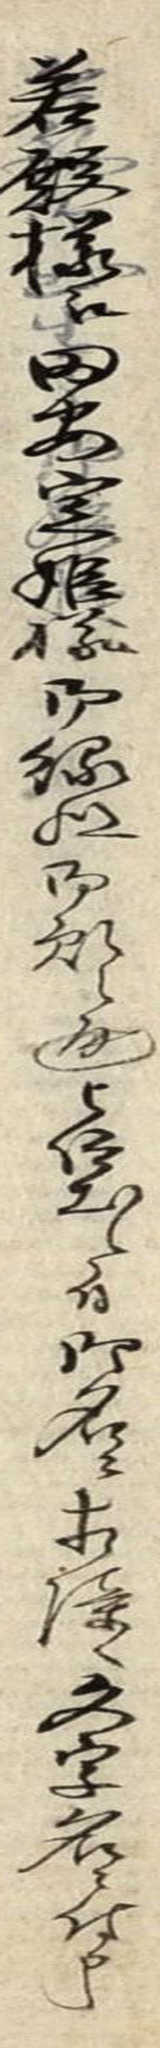若殿様江田安定姫様御縁組御願之通被仰出候に付御名に相障候文字名に付申
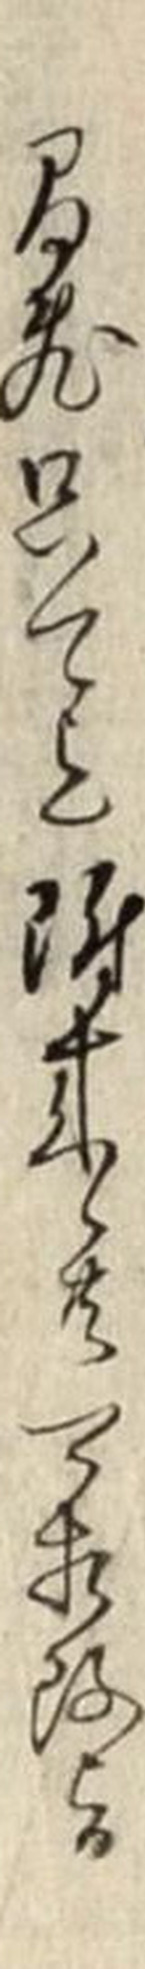間敷只今迄附来候共可相改旨
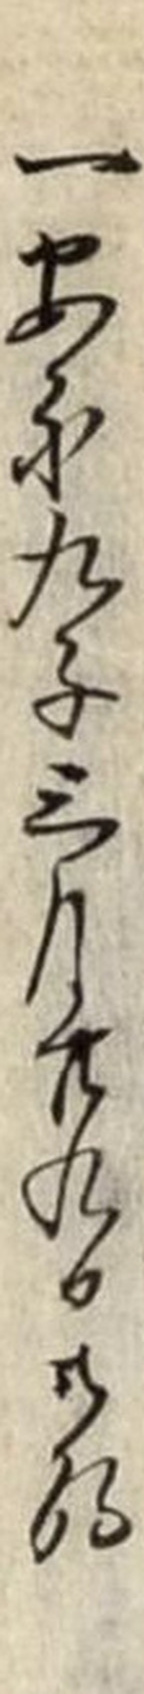一安永九子三月廿九日御触
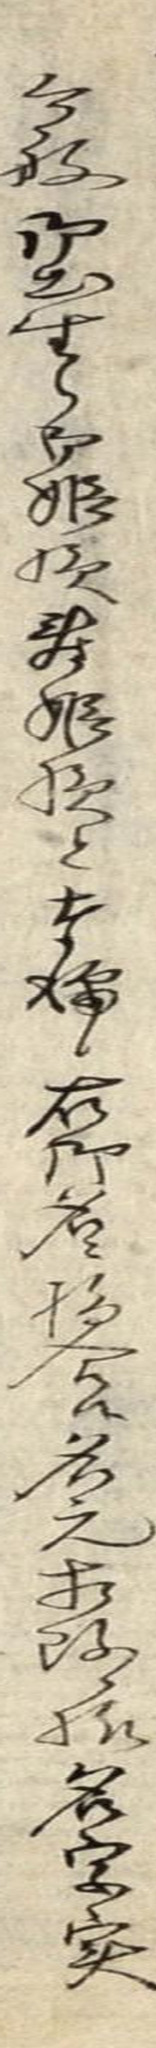今般御出生之御姫様寿姫様と奉称候右御名に指合候名元相改候様名字実
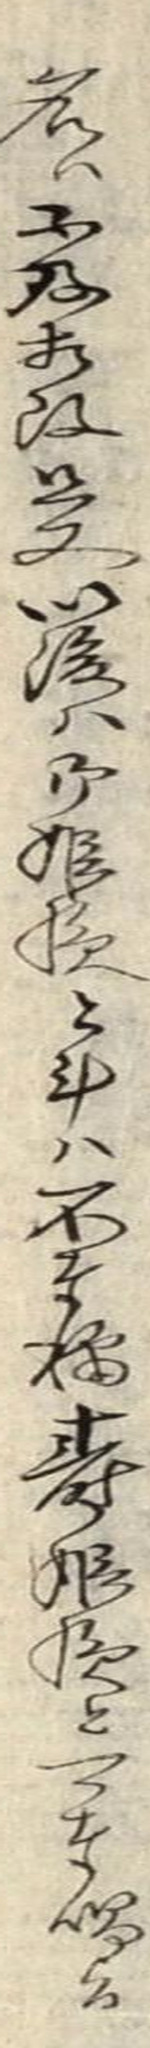名は不及相改且又以後は御姫様と斗は不奉称寿姫様と可奉唱旨
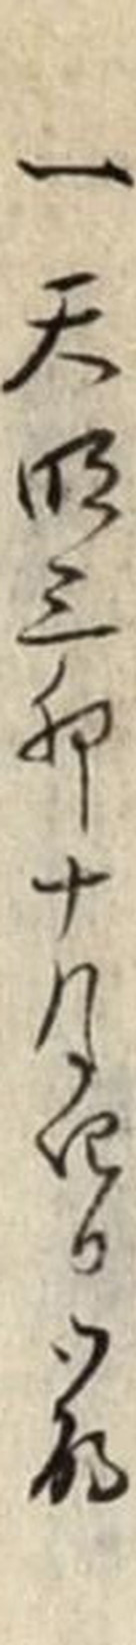一天明三卯十月四日御触
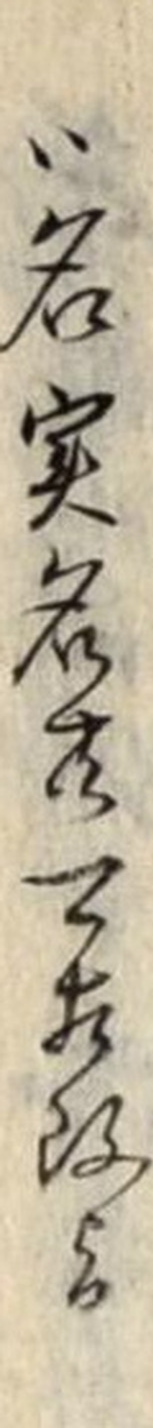は名実名共可相改旨

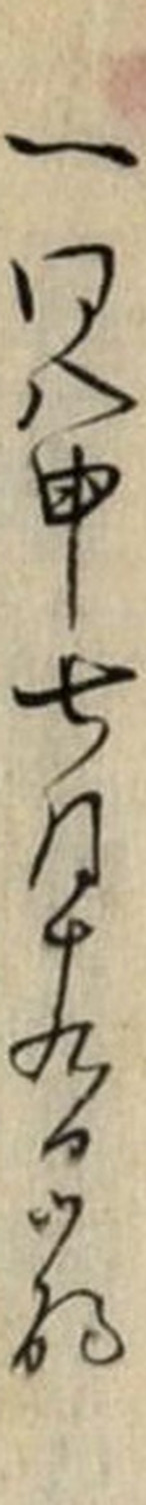一同八申七月十九日御触
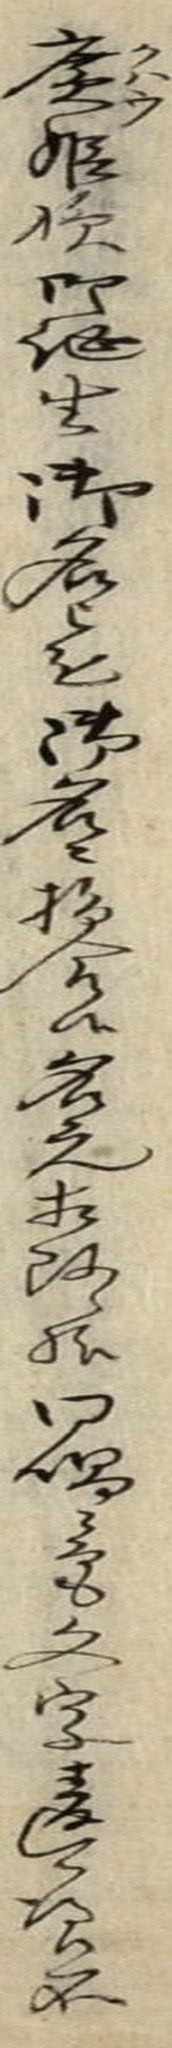広姫様御誕生御名被進御名に指合候名元相改候様同唱に而も文字違候得は不
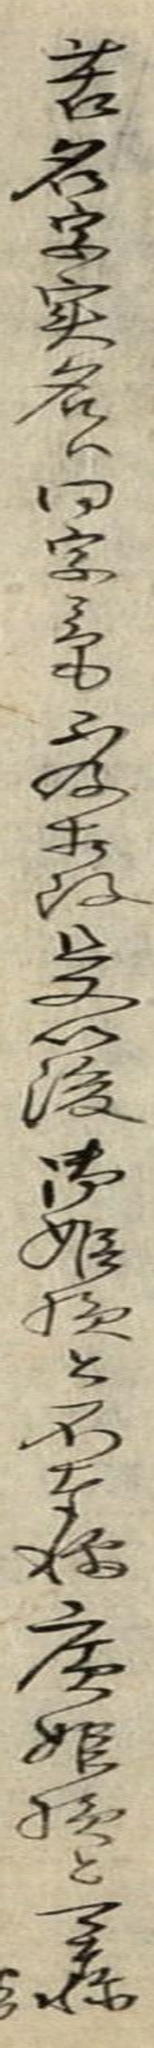苦名字実名は同字に而も不及相改且又以後御姫様と不奉称広姫様と可奉称候旨
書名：蒐輯之部
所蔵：福井県文書館 Fukui Prefectural Archives
